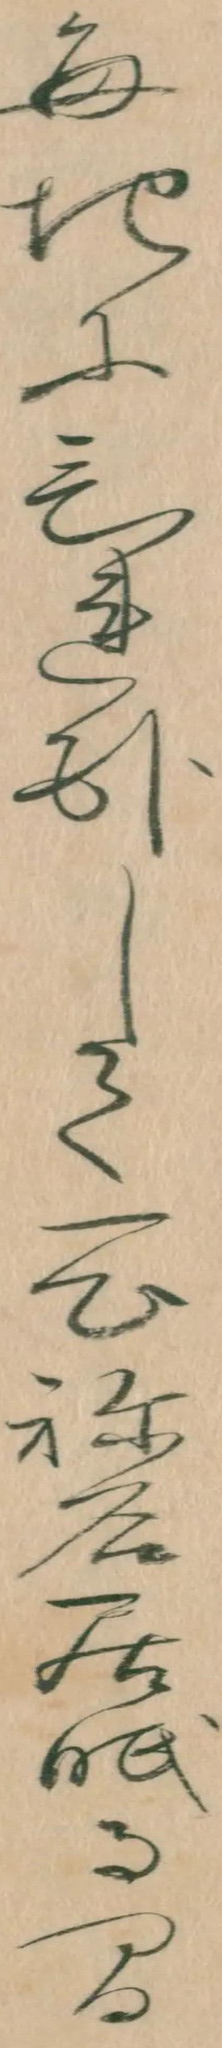毎地にひれ臥して一心称名居眠る間
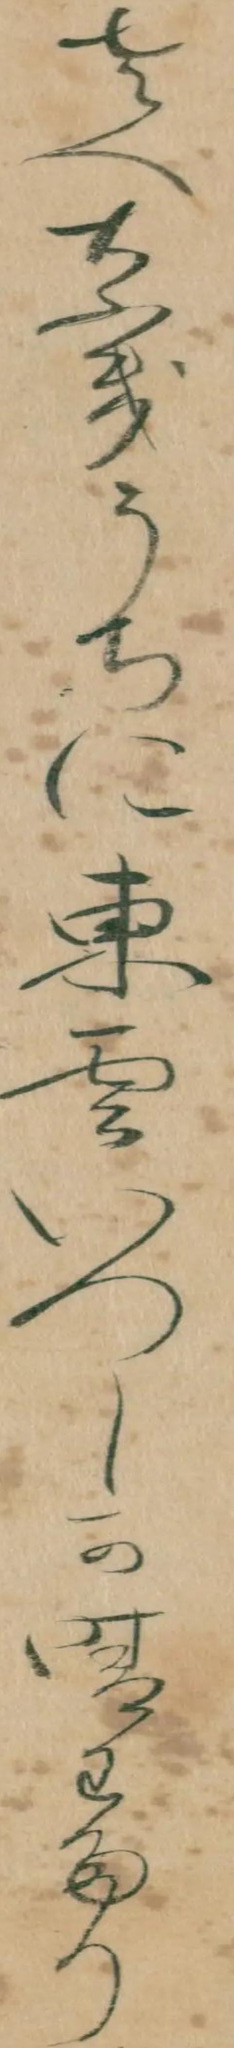さへなきうちに東雲いつしか晴わたり
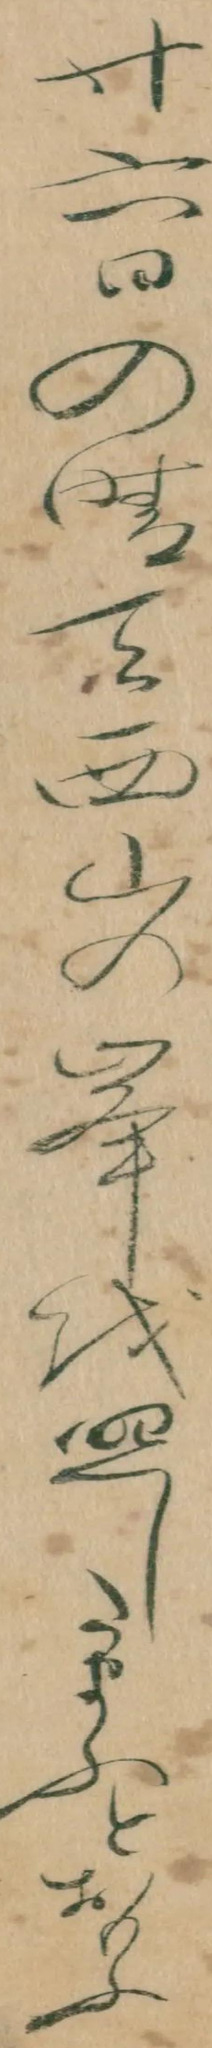廿六日の晴天西山の峰を照したまふとおもふ
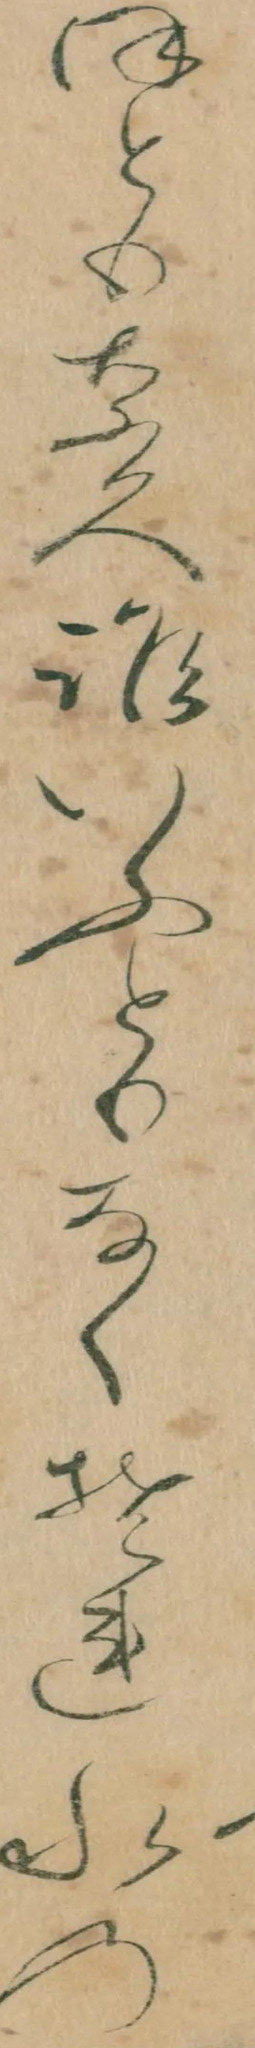ほともなく誰いふともなくそれ水の
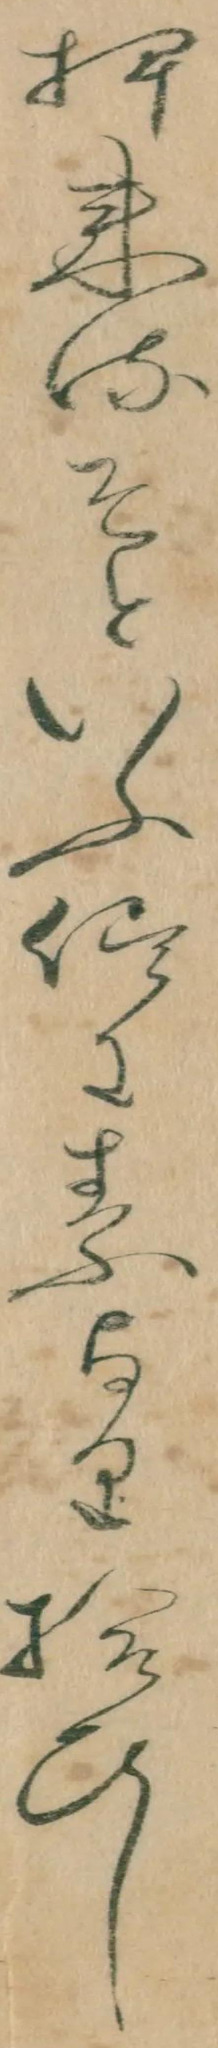押来るそといふ儘に素より拾ひし
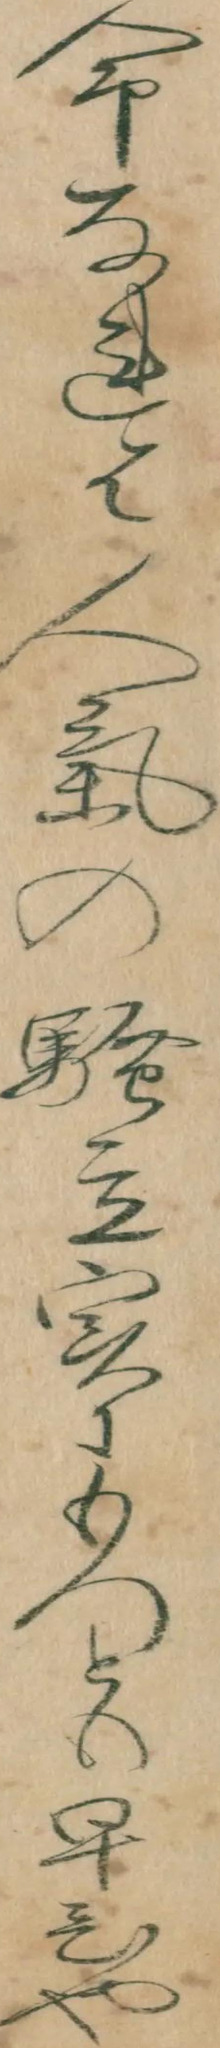命なれは人気の騒立実にもつとも早ひや
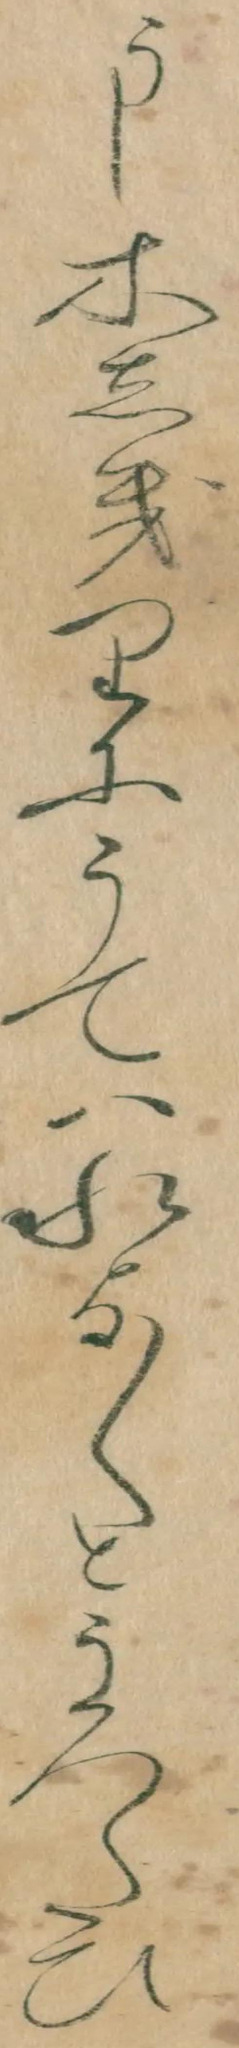うし木しきりにうては水よ〳〵とうっつたひ
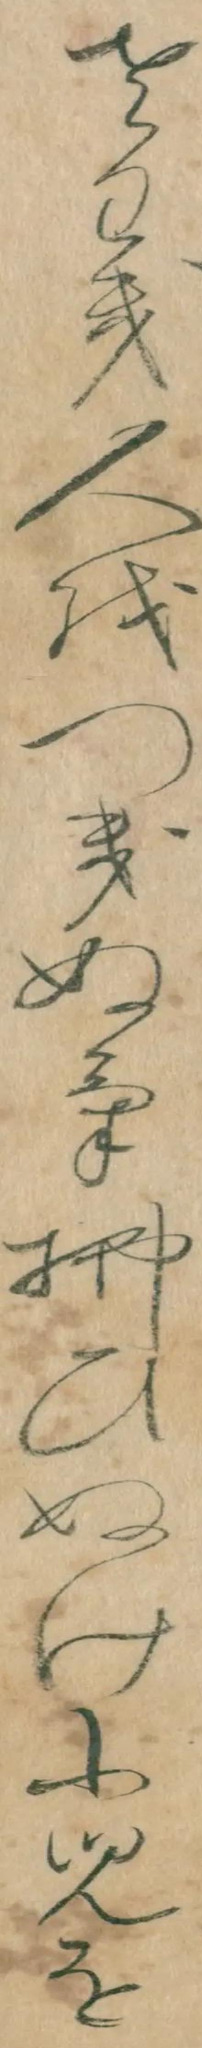さわき人をつきぬけ払ひぬけ小児を
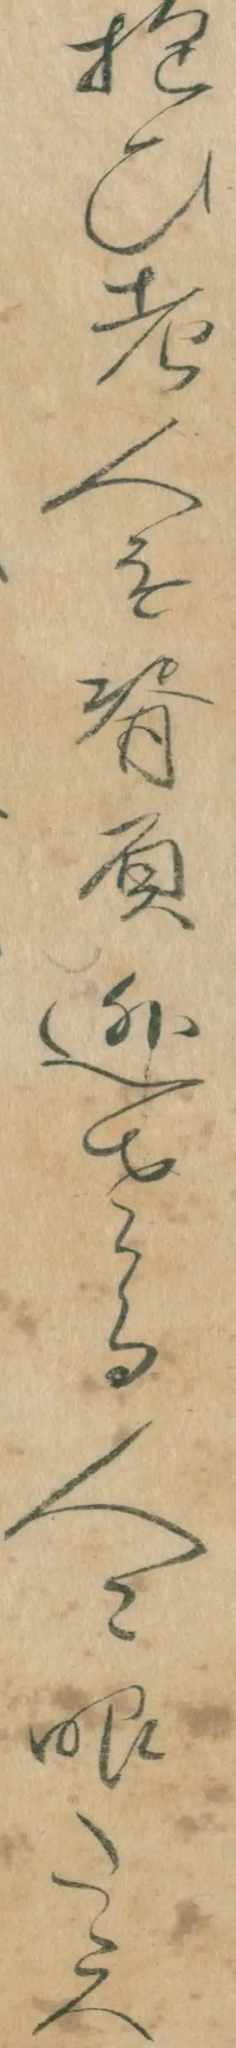抱ひ老人を背負逃さる人々眼たゝく
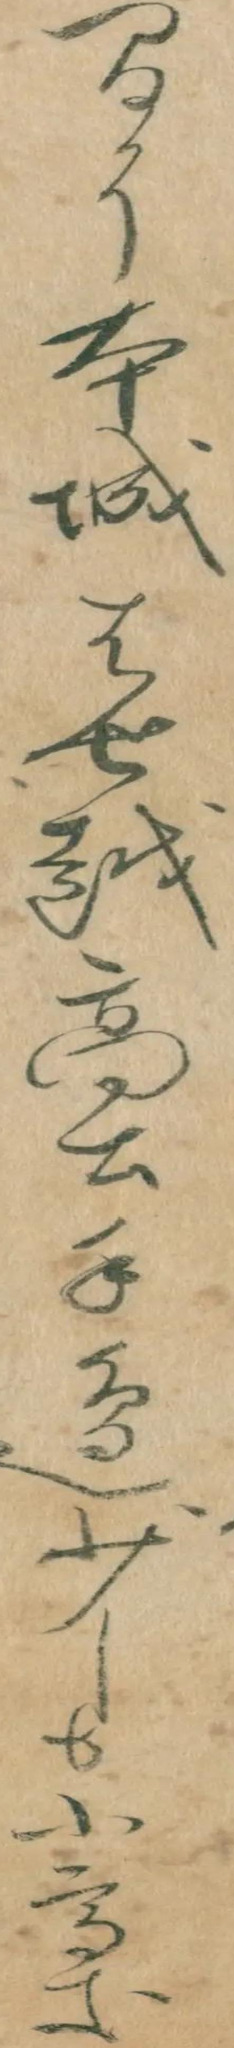間に本城はせ越高土手辺少しも小高き
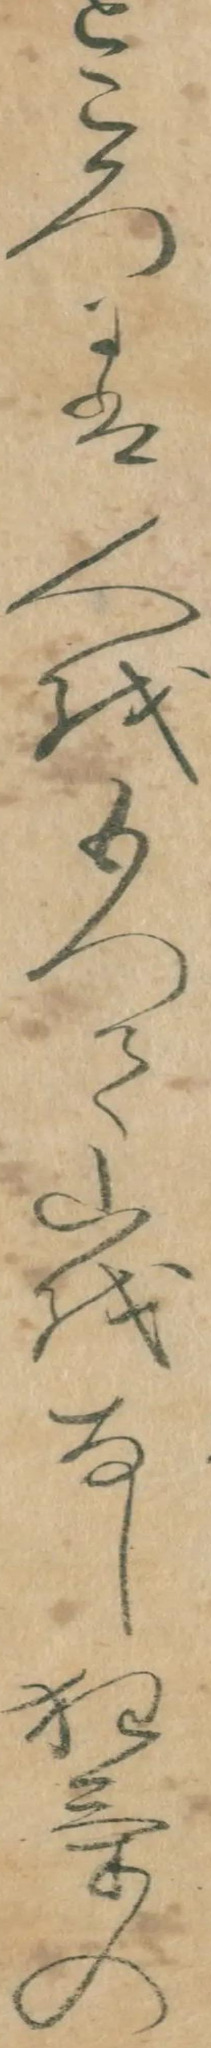ところには人をもつて山をなし狂気の

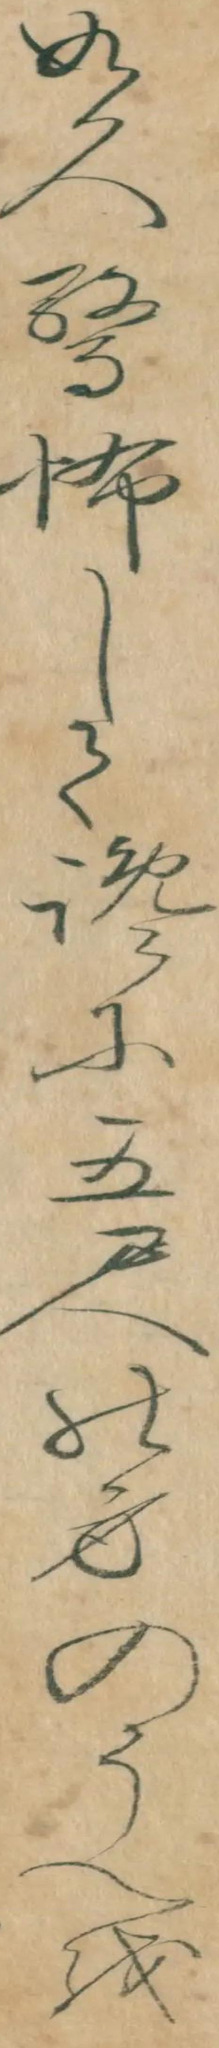如く驚怖して纔に五尺の身のうへを
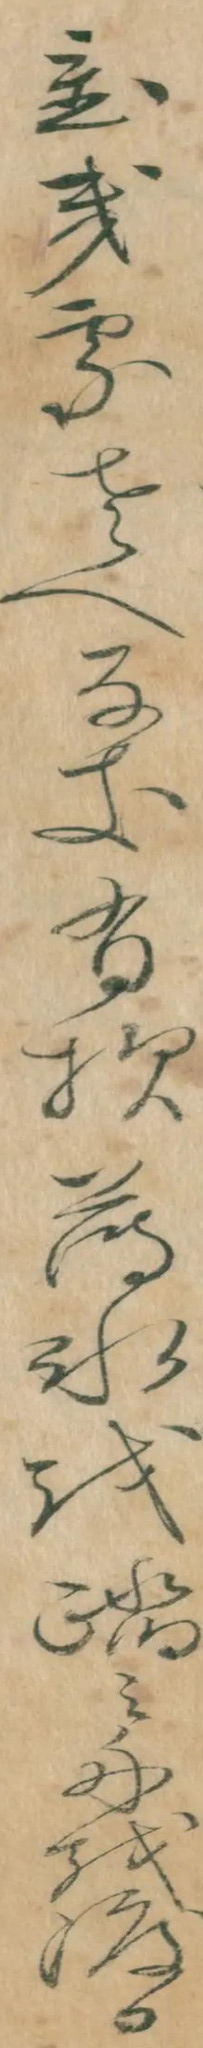置き處さへなき有様薄氷を踏み舟を渡る
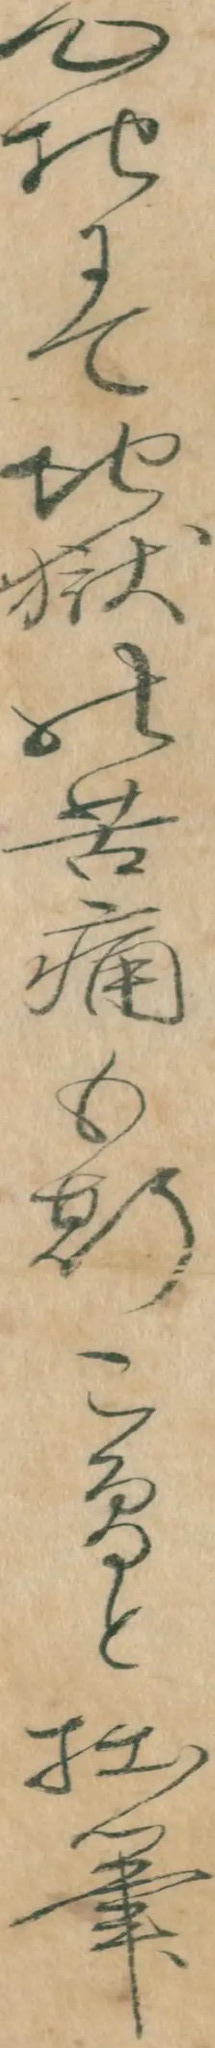心地にて地獄の苦痛も斯こそと拙筆
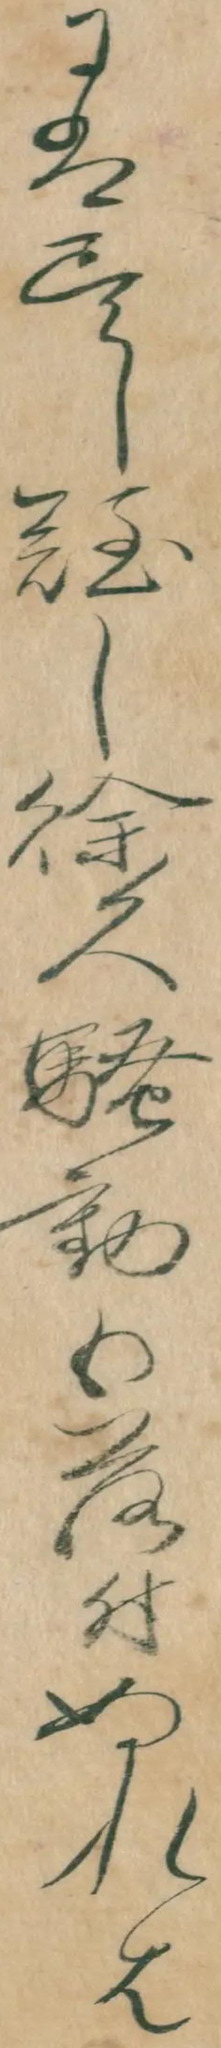には尽し難し徐く騒動も落付ぬれは
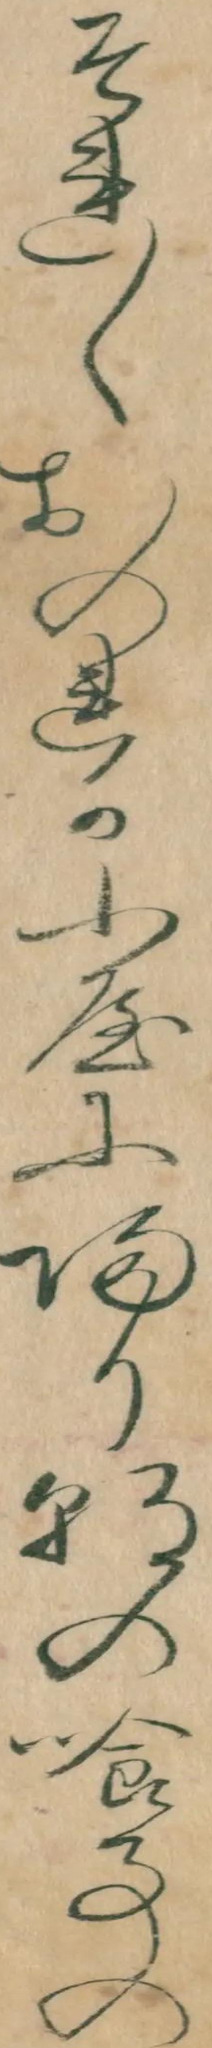それ〳〵おのれか小屋に帰り朝の喰事の
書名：俗語之種. [5]
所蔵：国立国会図書館 National Diet Library, JAPAN
